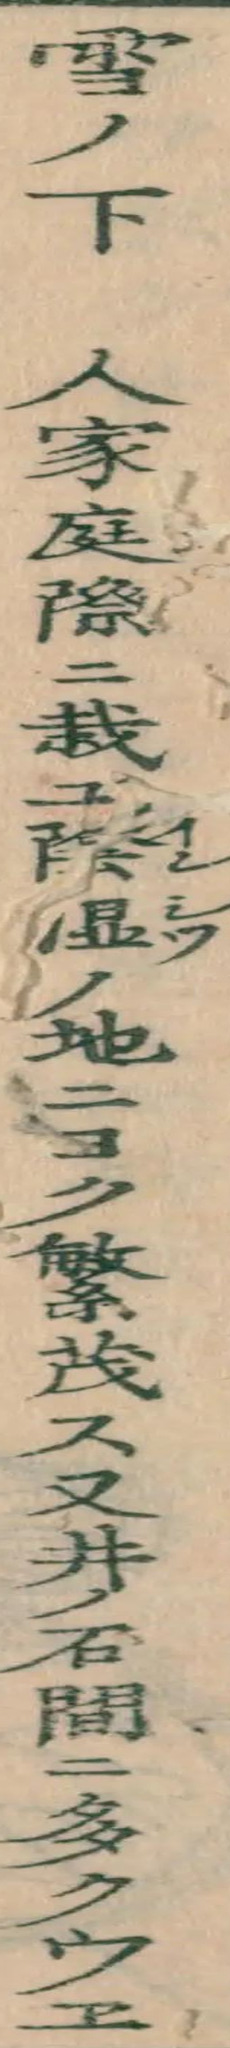雪ノ下人家庭際ニ栽ユ陰湿ノ地ニヨク繁茂ス又井ノ石間ニ多クウヱ
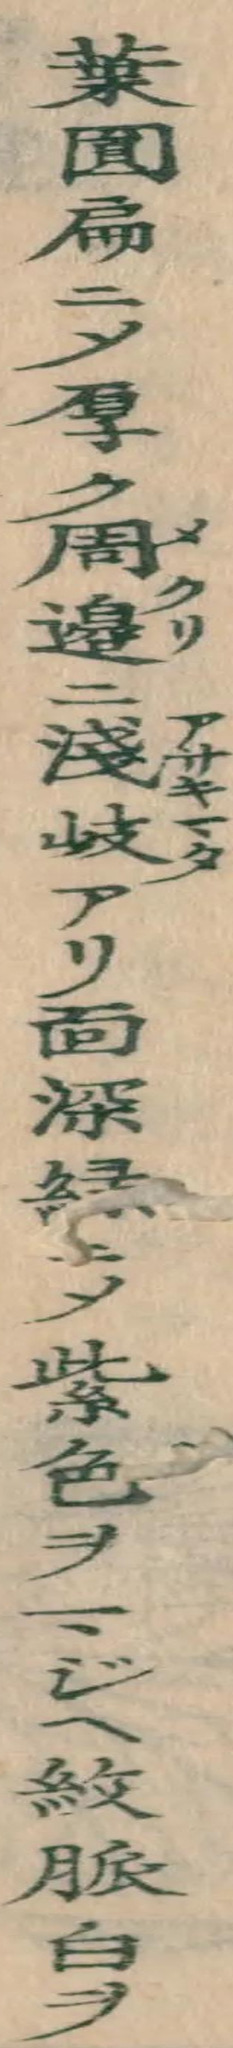葉円扁ニシテ厚ク周辺ニ浅岐アリ面深ニシテ紫色ヲマジヘ紋脈白ヲ
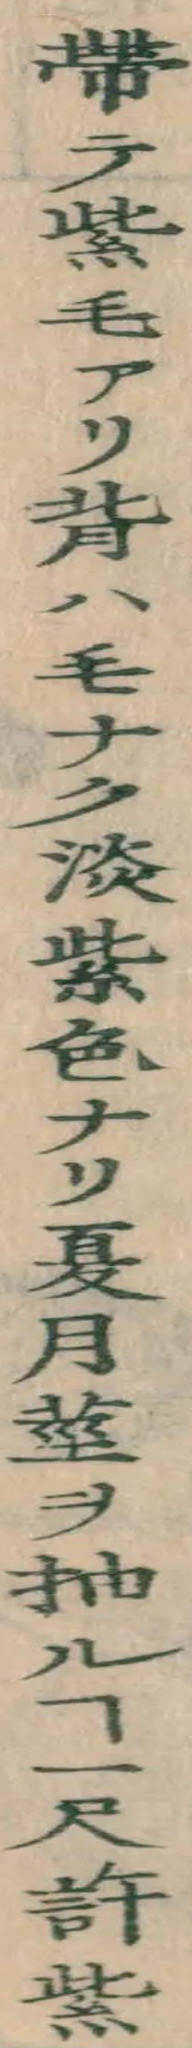帯テ紫毛アリ背ハ毛ナク淡紫色ナリ夏月茎ヲ抽ルコト一尺許紫
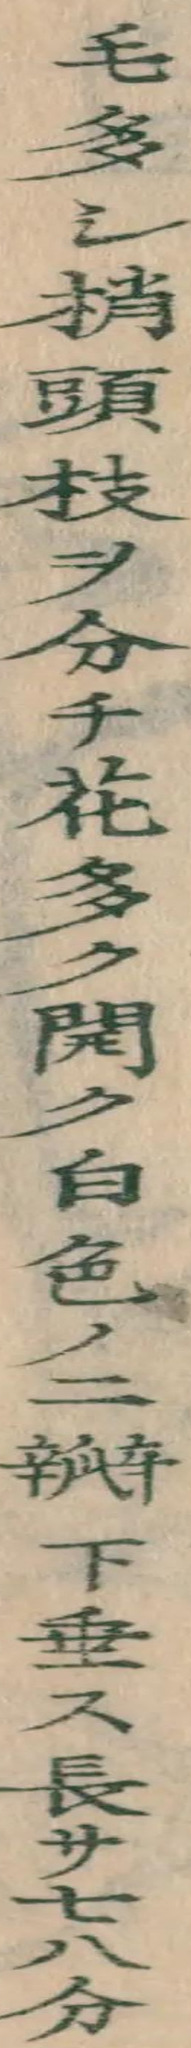毛多シ梢頭枝ヲ分チ花多ク開ク白色ノ二弁下垂ス長サ七八分
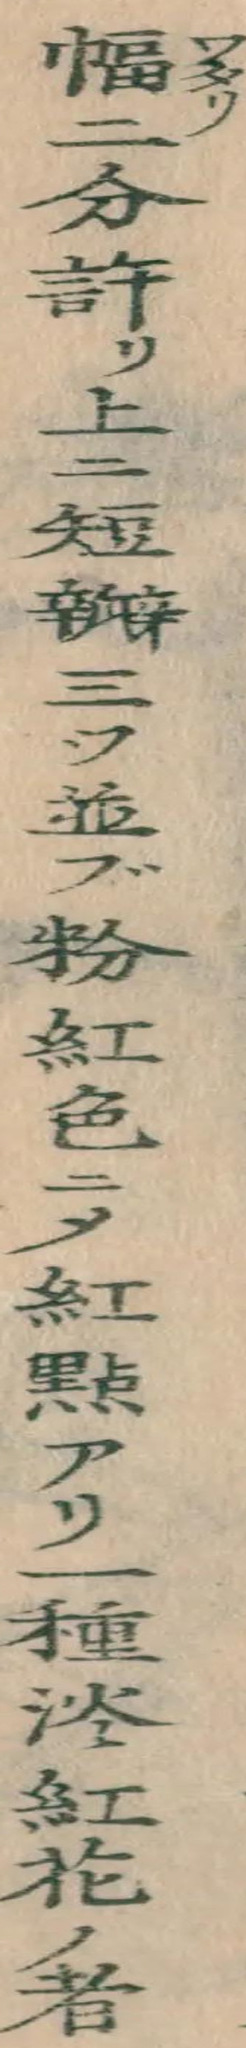幅二分許上ニ短弁三ツ並ブ粉紅色ニシテ紅点アリ一種淡紅花ノ者
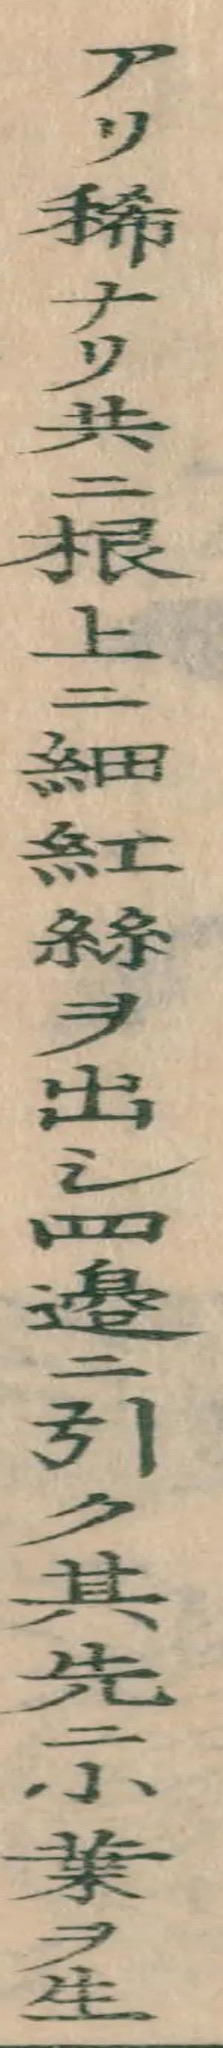アリ稀ナリ共ニ根上ニ細紅糸ヲ出シ四辺ニ引ク其先ニ小葉ヲ生
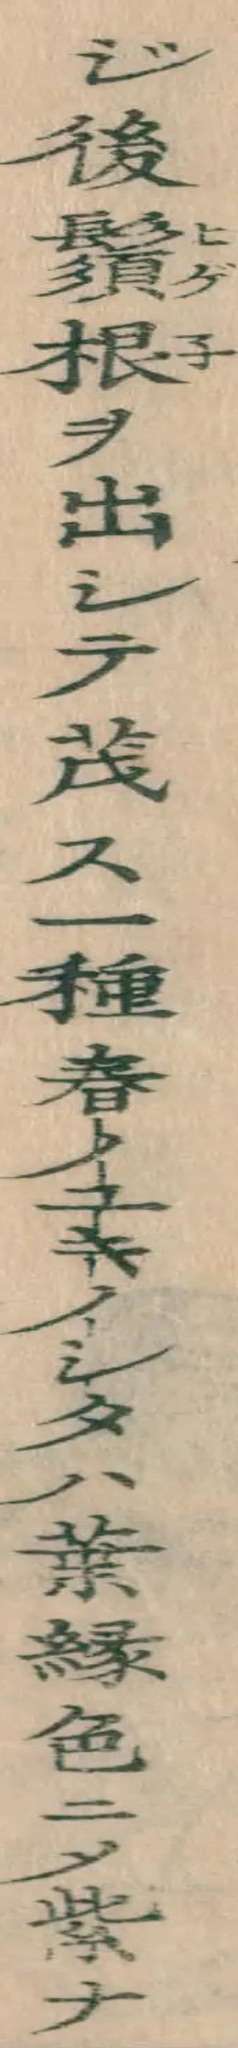ジ後鬚根ヲ出シテ茂ス一種春-ノ-ユ-キ-ノ-シ-タハ葉縁色ニシテ紫ナ
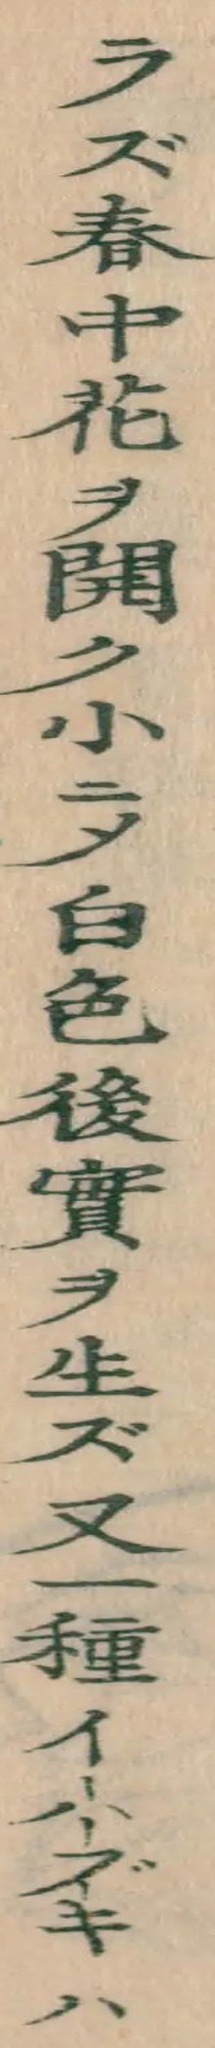ラズ春中花ヲ開ク小ニシテ白色後実ヲ生ズ又一種イ-ハ-ブ-キハ
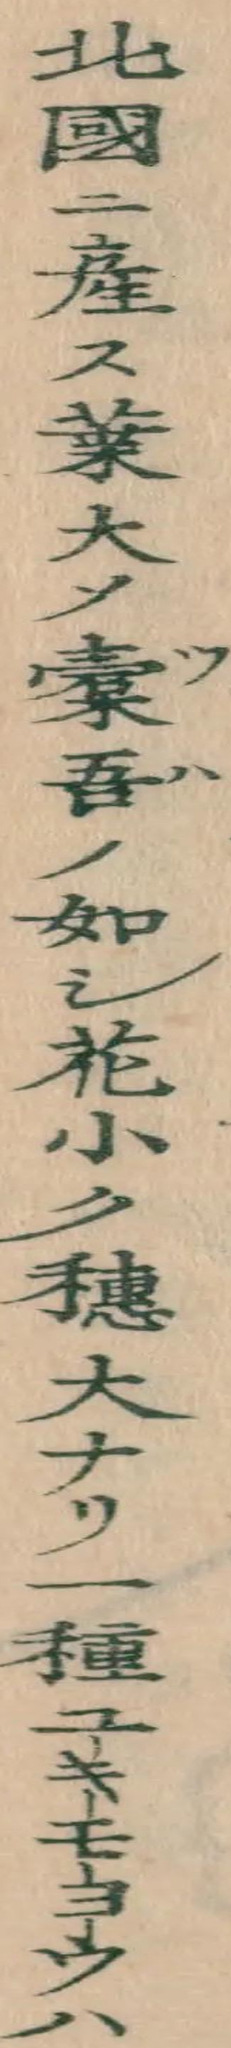北国ニ産ス葉大シテ橐吾ノ如シ花小ク穂大ナリ一種ユ-キ-モ-ヨ-ウハ
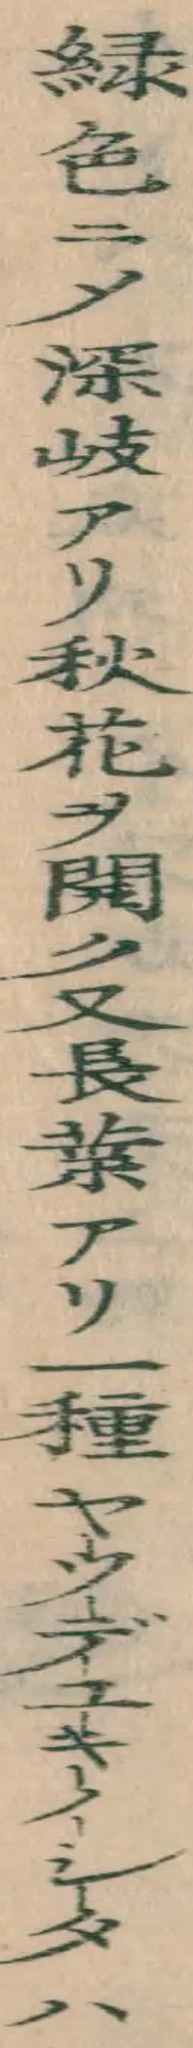緑色ニシテ深岐アリ秋花ヲ開ク又長葉アリ一種ヤ-ツ-デ-ユ-キ-ノ-シ-タハ
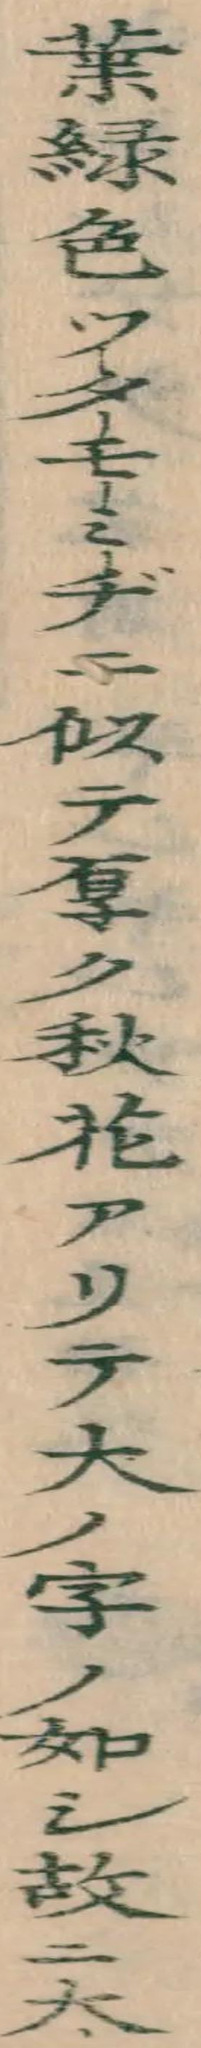葉緑色ツ-タ-モ-ミ-ヂニ似テ厚ク秋花アリテ大ノ字ノ如シ故ニ大
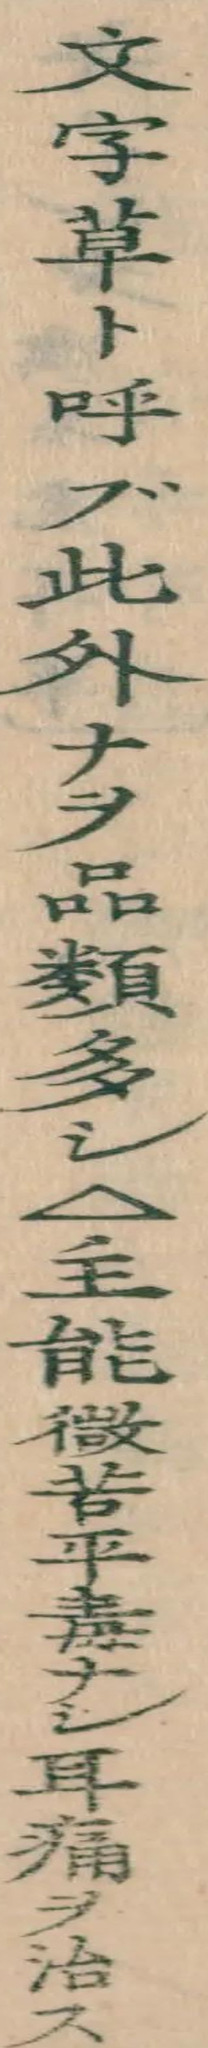文字草ト呼ブ此外ナヲ品類多シ△主能微苦平毒ナシ耳痛ヲ治ス
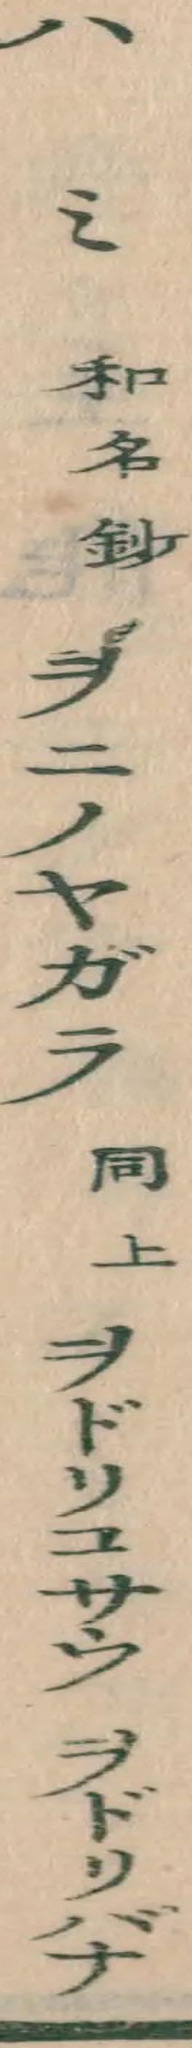ハミ和名鈔ヲニノヤガラ同上ヲドリコサウヲドリバナ

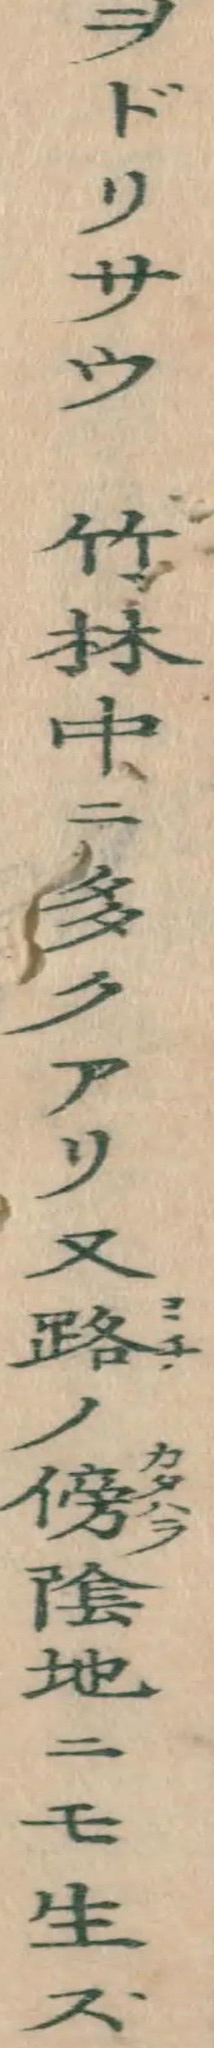ヲドリサウ竹林中ニ多クアリ又路ノ傍陰地ニモ生ズ
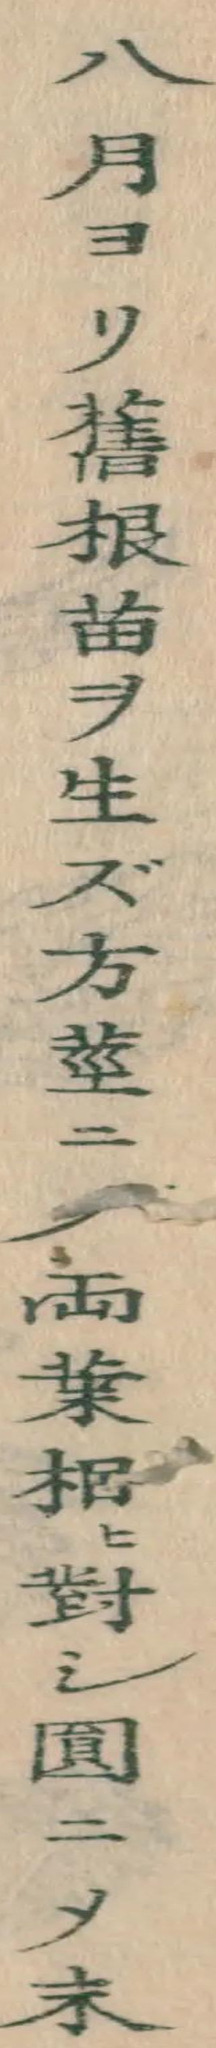八月ヨリ旧根苗ヲ生ズ方茎ニシテ両葉相対シ円ニシテ末
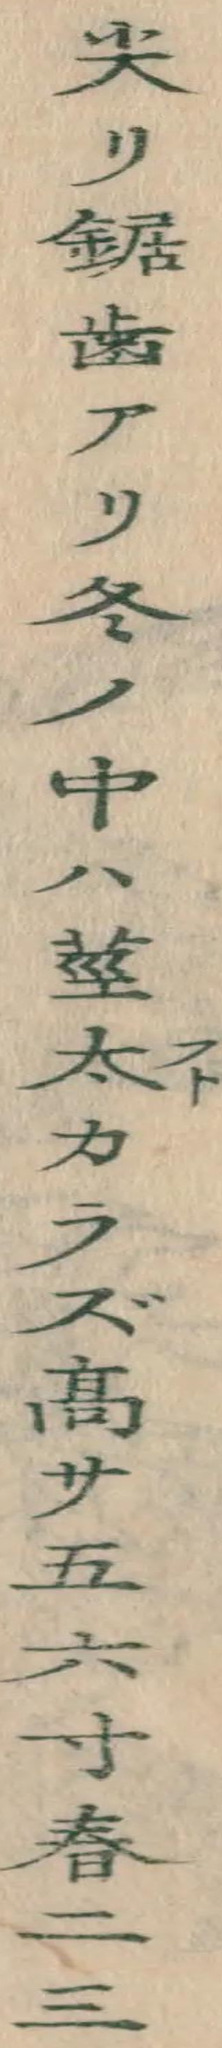尖リ鋸歯アリ冬ノ中ハ茎太カラズ高サ五六寸春二三
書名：これこれ草 2巻. [2]
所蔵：国立国会図書館 National Diet Library, JAPAN
